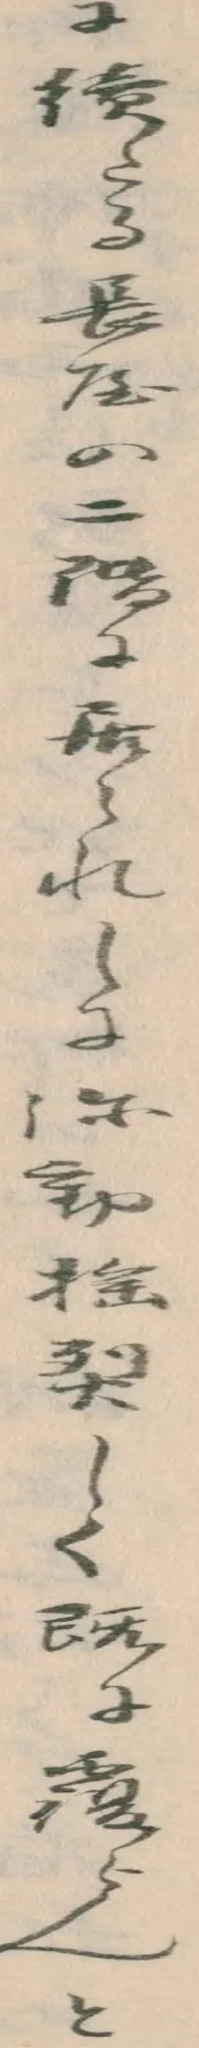に続たる長屋の二階に居られしに弥動揺烈しく既に覆らんと
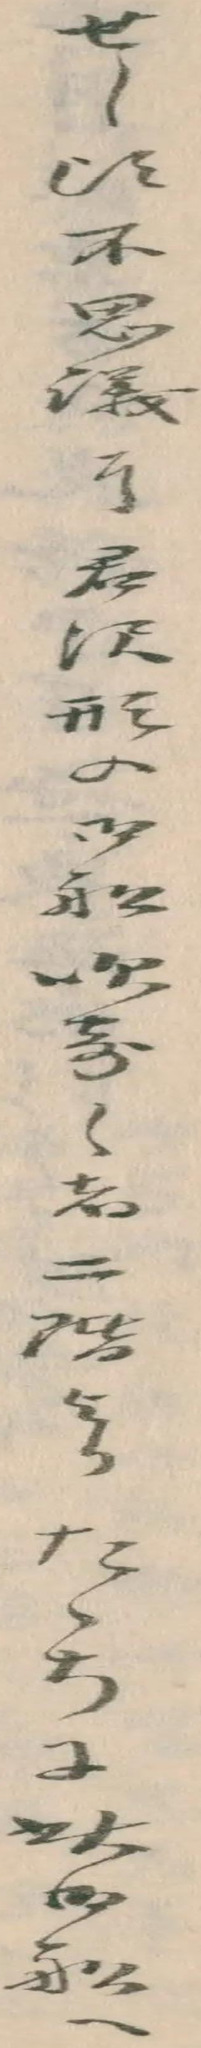せし頃不思議に君沢形の御船吹寄しは二階よりたゝちに此御船へ
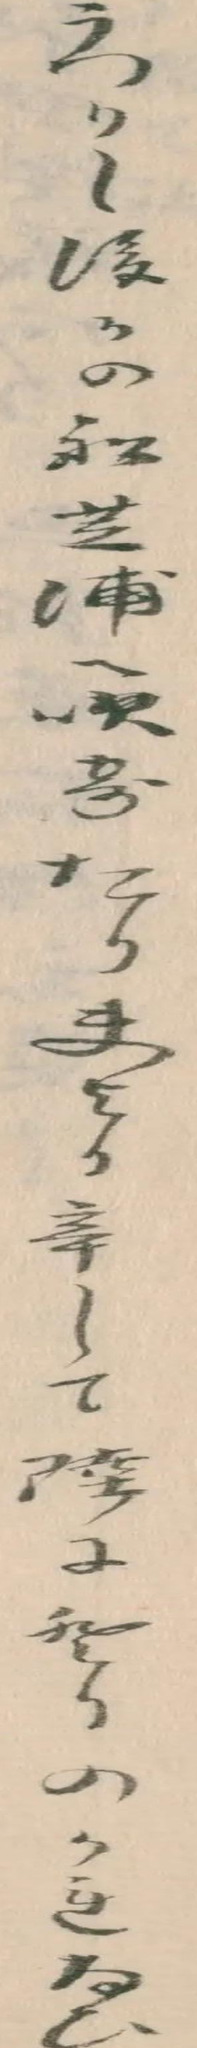うつりし後かの船芝浦へ吹寄たり夫より辛して陸に登りのかれ給ひ
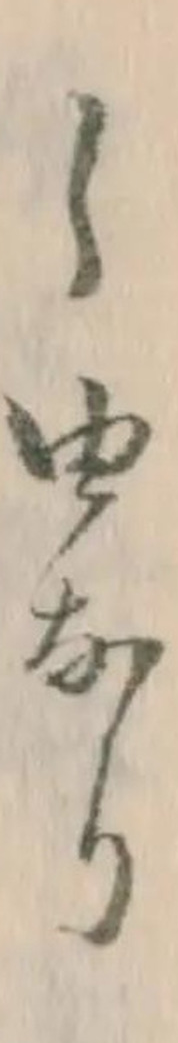し由なり
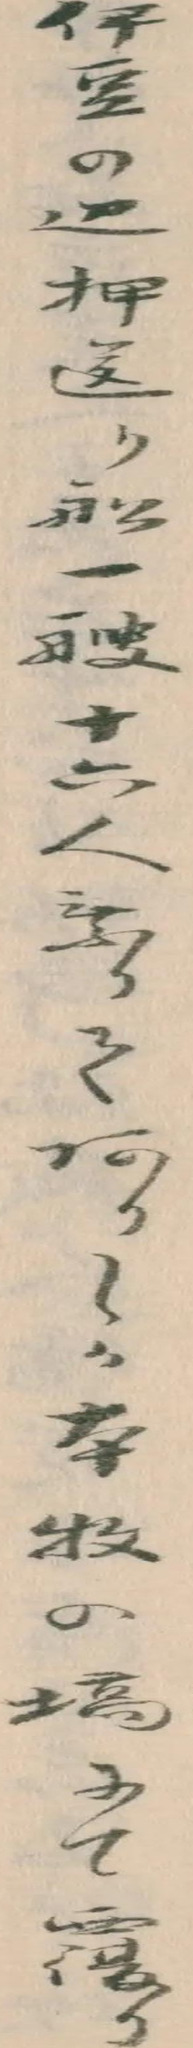伊豆の辺押送り船一艘十六人乗りてありしか本牧の塙にて覆り
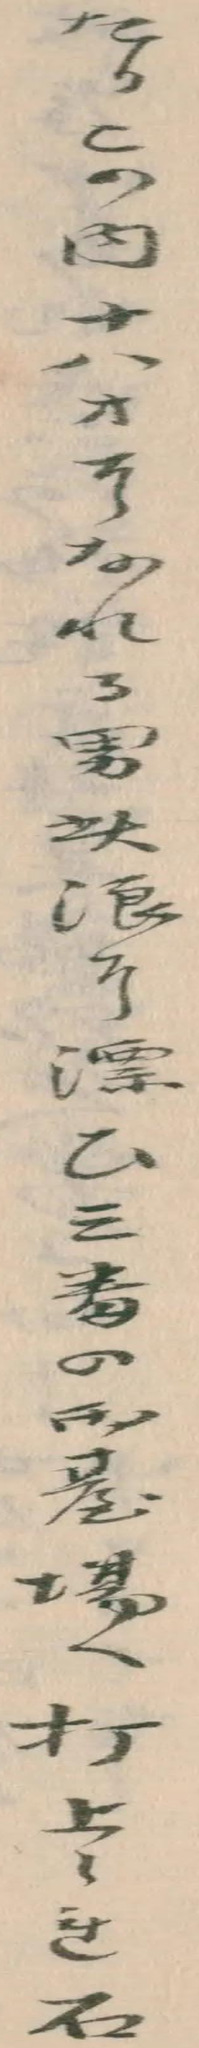たりこの内十八才になれる男此浪に漂ひ三番の御台場へ打上られ石
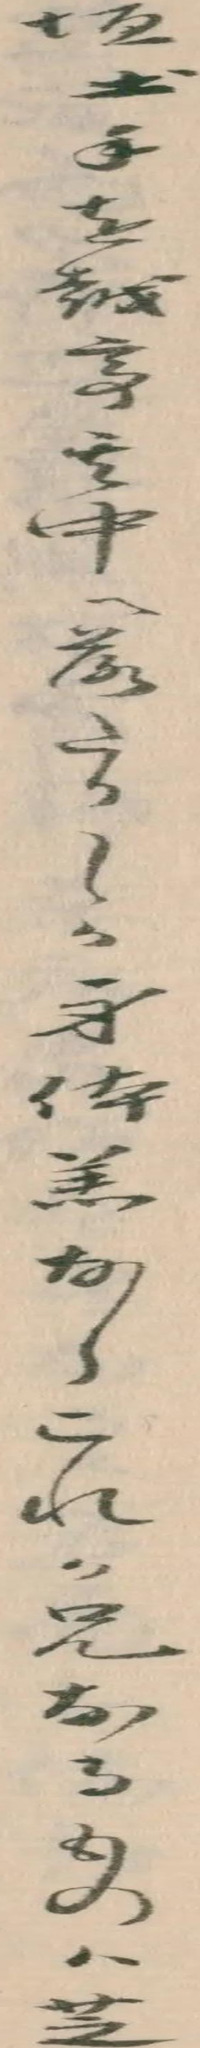垣土手を越て其中へ落たりしか身体恙なくこれか兄なるものは芝
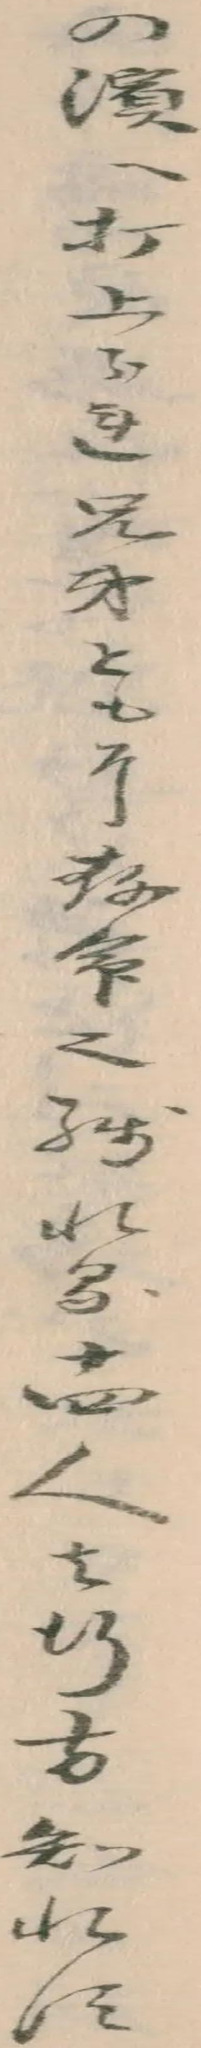の浜へ打上られ兄弟ともに存命也残れる十四人は行方知れす
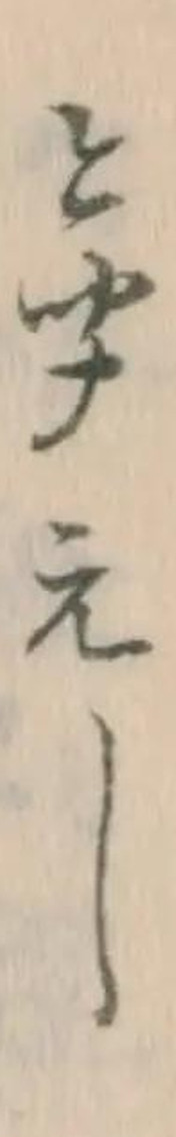と聞えし
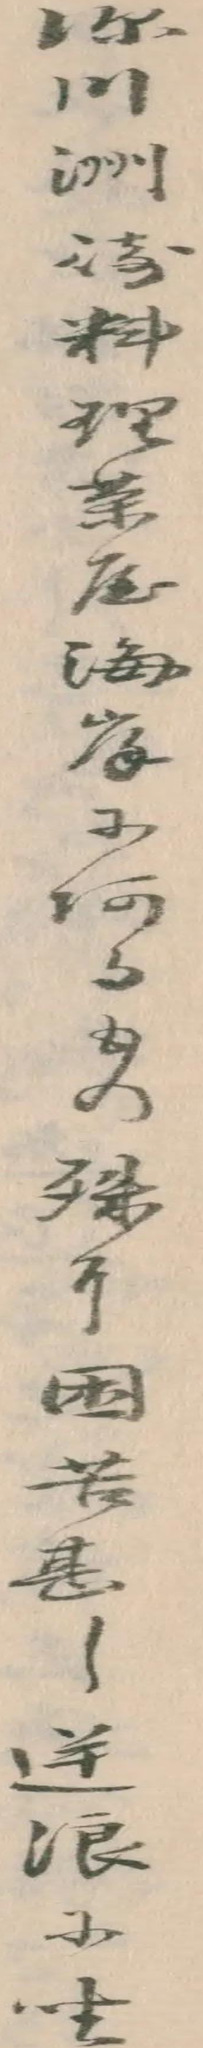深川洲崎料理茶屋海岸にあるもの殊に困苦甚し逆浪に坐
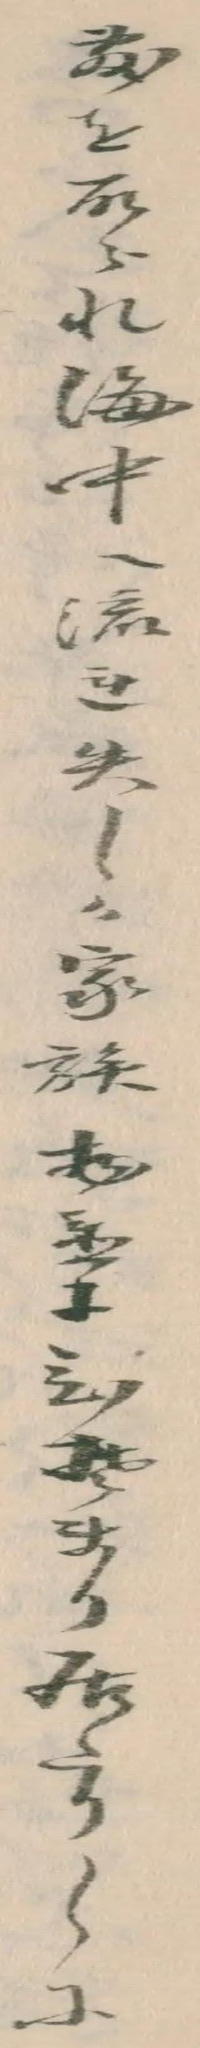敷を取られ海中へ流れ失しか家族物置にひそまり居たりしに
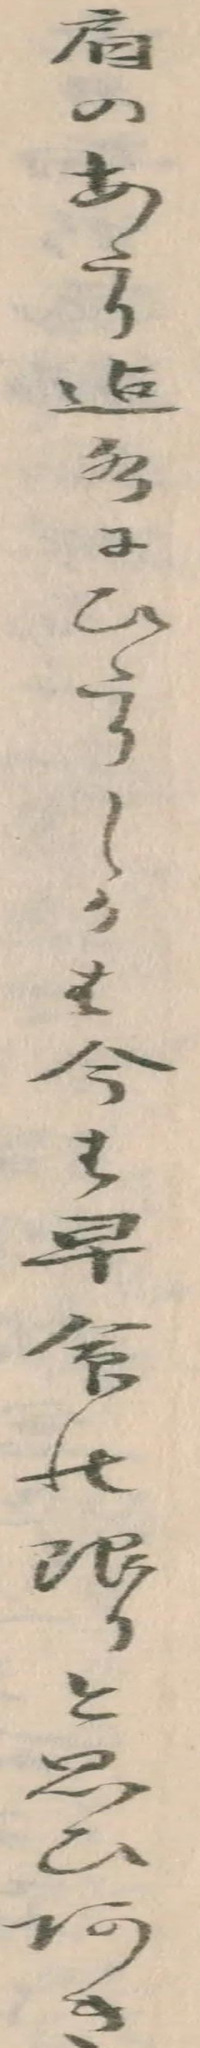肩のあたり迄水にひたりしかは今は早命の限りと思ひあき
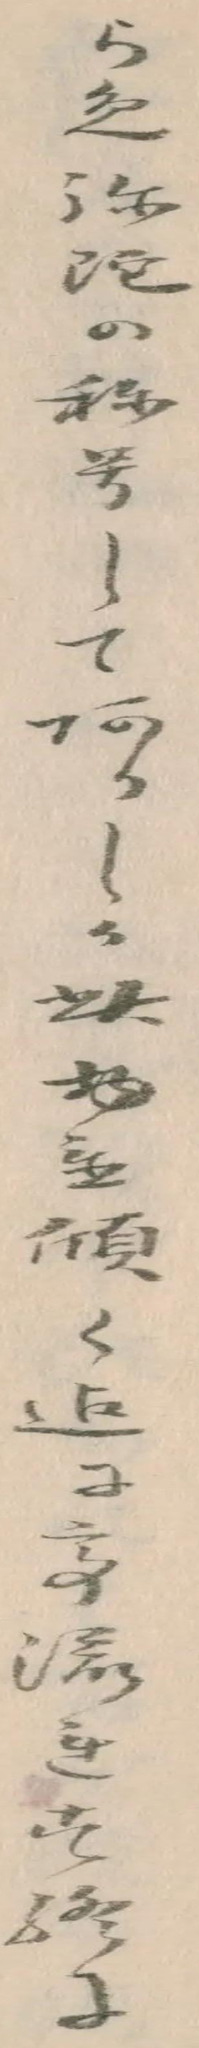らめ弥陀の称号してありしか此物置傾く迄にて流れす終に
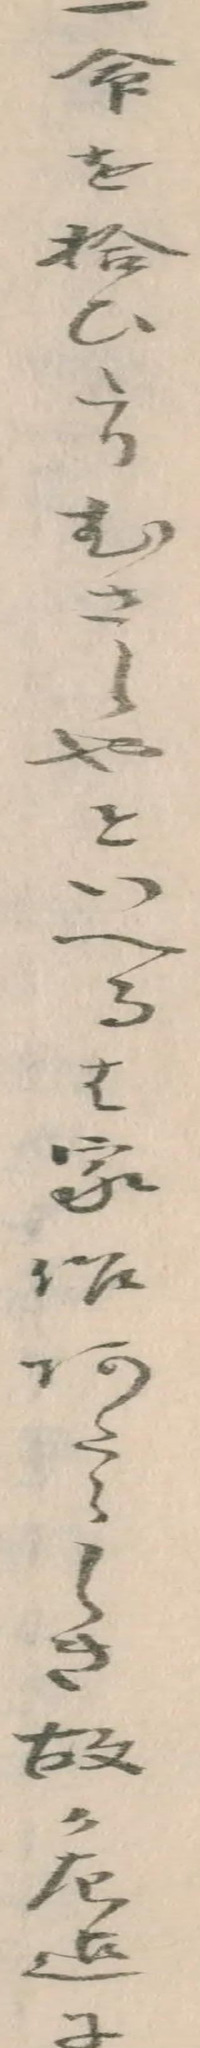一命を拾ひたりむさしやといへるは家作あたらしき故か左迄に
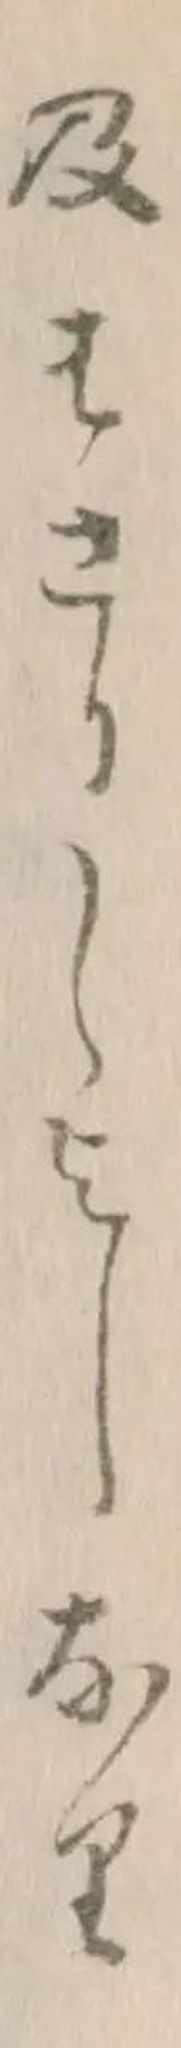及はさりしよしなり
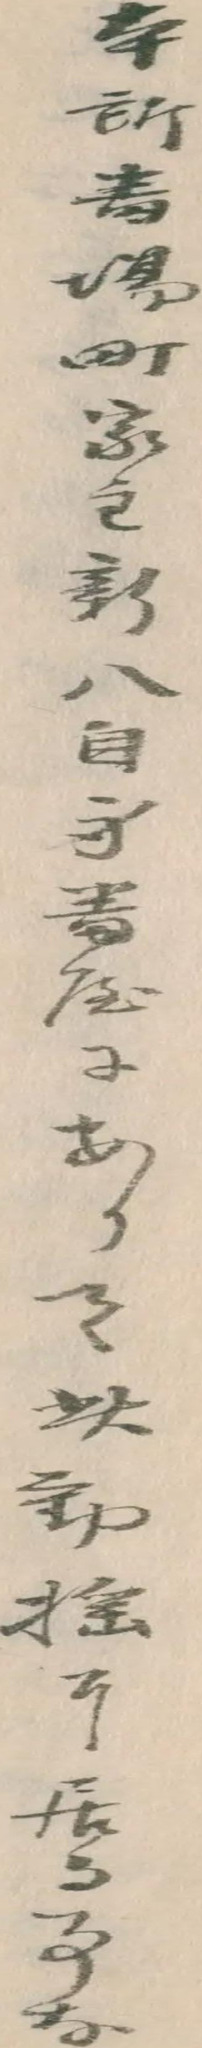本所番場町家主新八自身番屋にありて此動揺に居る事な
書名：地災撮要. 巻10(地震之部) 上,下
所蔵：国立国会図書館 National Diet Library, JAPAN
